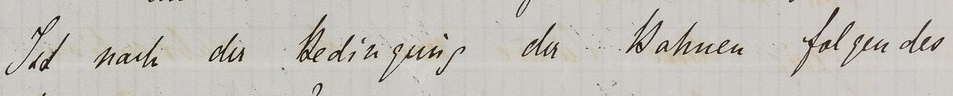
Ist nach der Bedingung der Bahnen folgendes
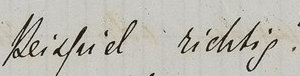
Beispiel richtig?
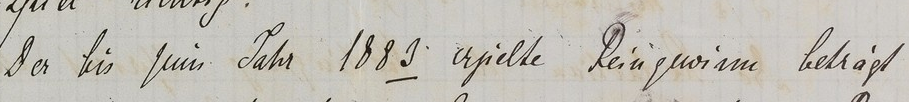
Der bis zum Jahr 1883 erzielte Reingewinn beträgt
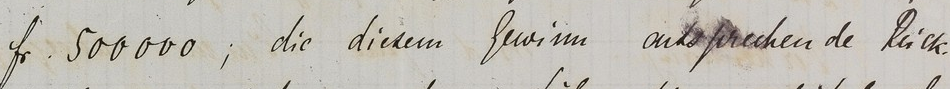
Fr. 500 000; die diesem Gewinn entsprechende Rück-
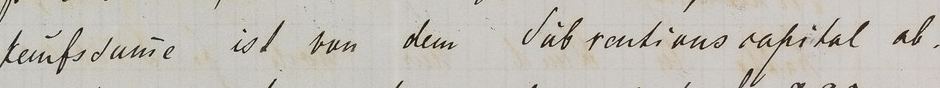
kaufssumme ist von dem Subventionscapital ab-
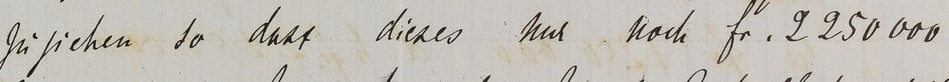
zuziehen so dass dieses nur noch Fr. 2 250 000
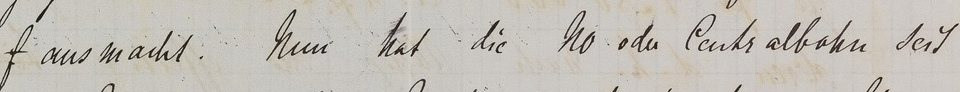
F ausmacht. Nun hat die NO oder Centralbahn seit
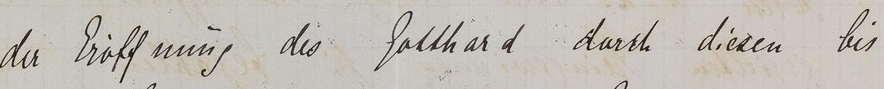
der Eröffnung des Gotthard durch diesen bis
